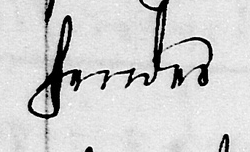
ehendes
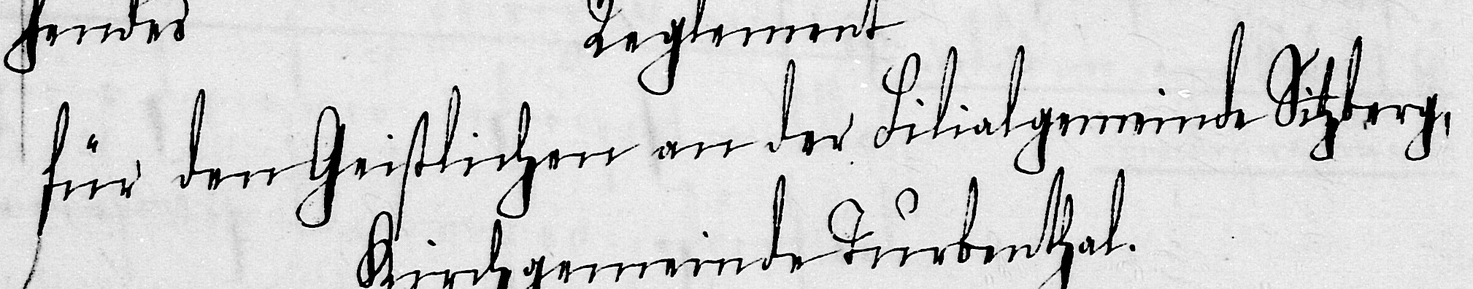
für den Geistlichen an der Filialgemeinde Sitzberg,
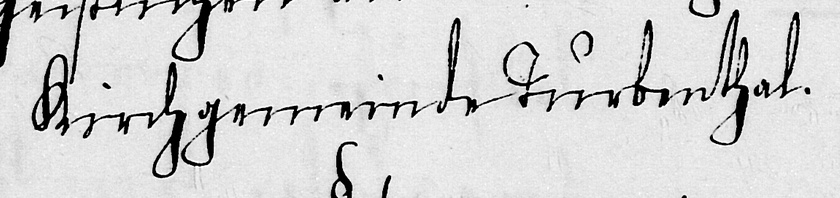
Kirchgemeinde Turbenthal.
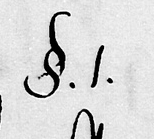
§. 1.
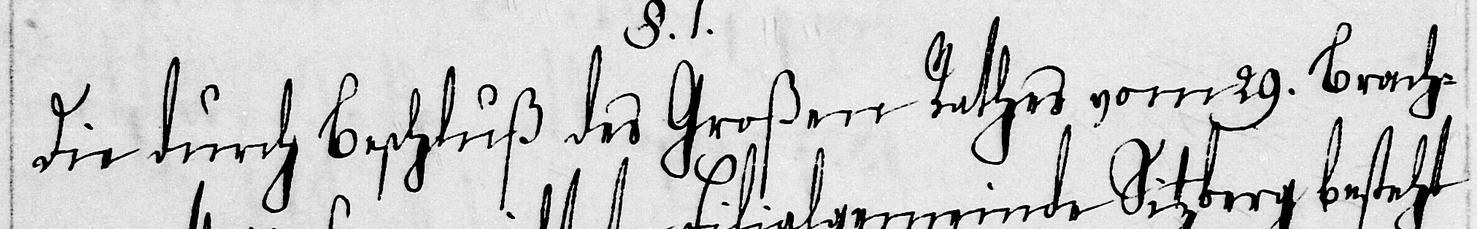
Die durch Beschluß des Großen Rathes vom 29. Brach¬
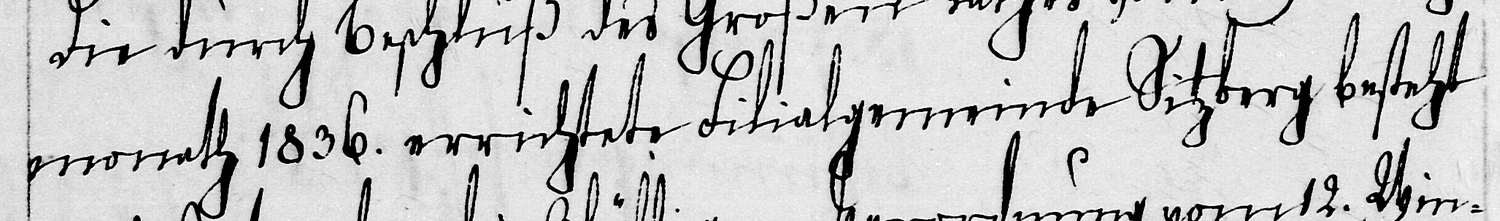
monath 1836. errichtete Filialgemeinde Sitzberg besteht
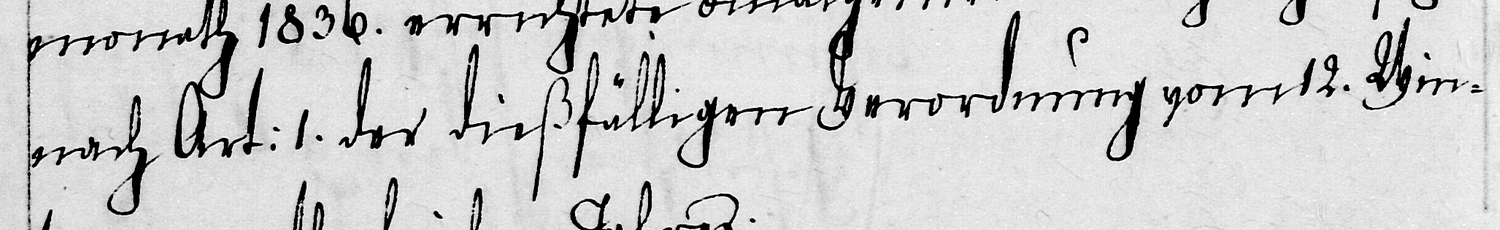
nach Art: 1. der dießfälligen Verordnung vom 12. Win¬
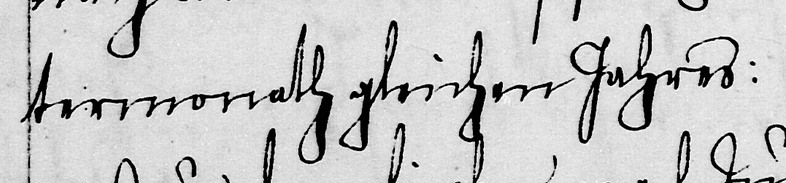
termonath gleichen Jahres:
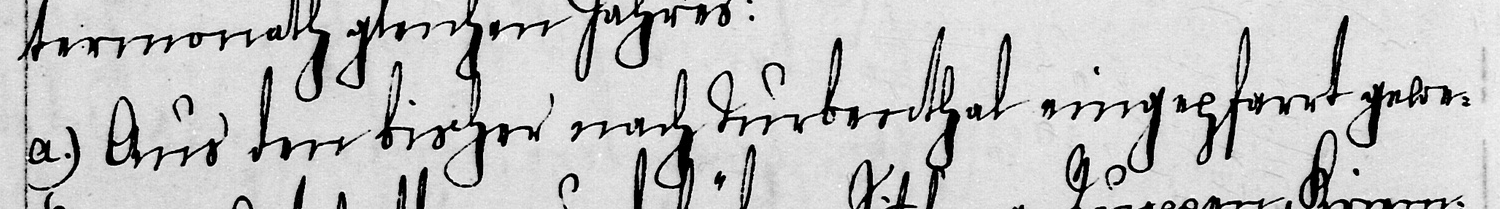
a.) Aus den bisher nach Turbenthal eingepfarrt gewe¬
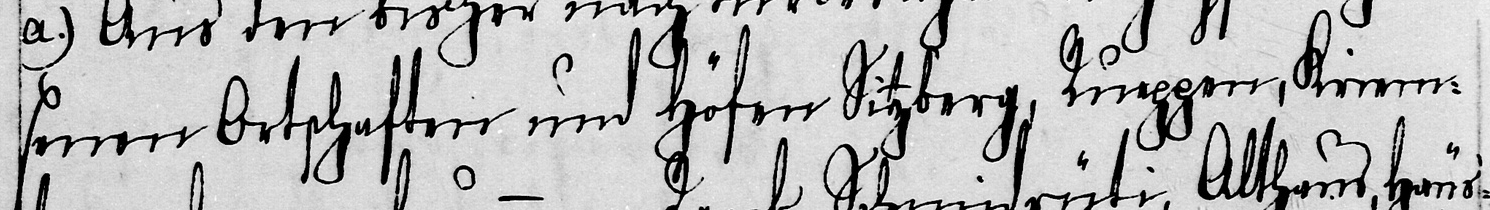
senen Ortschaften und Höfen Sitzberg, Rueppen, Kriem¬
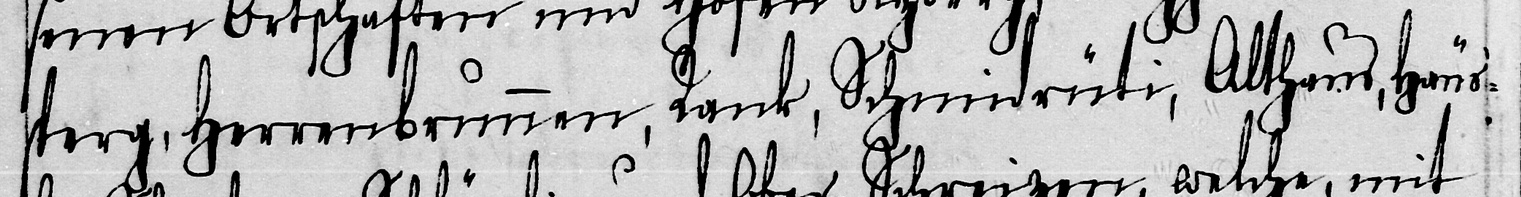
sperg, Herrenbrunnen, Rank, Schmidrüti, Althaus, Häus¬
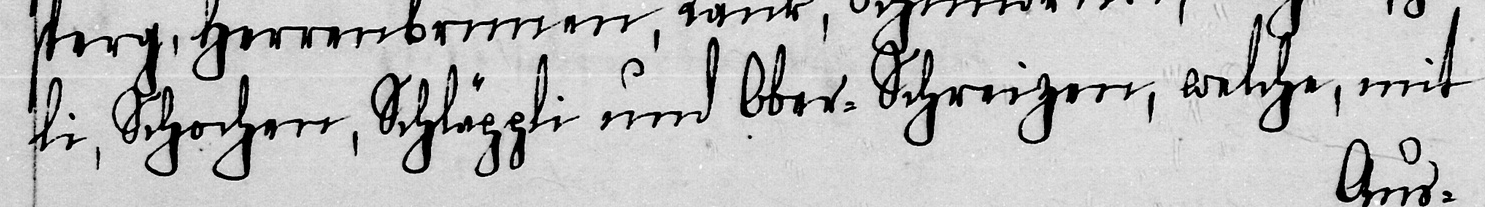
li, Schochen, Schläppli und Ober-Schweizen, welche, mit
